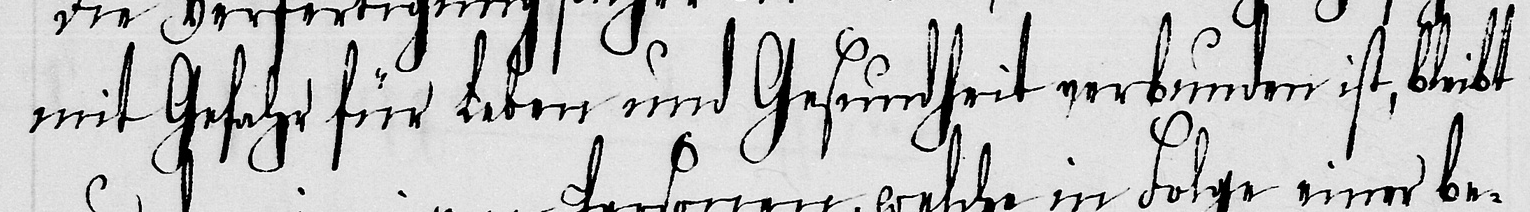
mit Gefahr für Leben und Gesundheit verbunden ist,
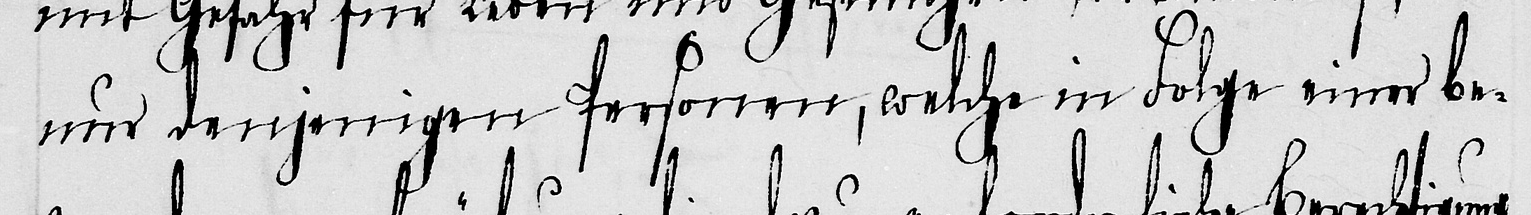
nur denjenigen Personen, welche in Folge einer be¬
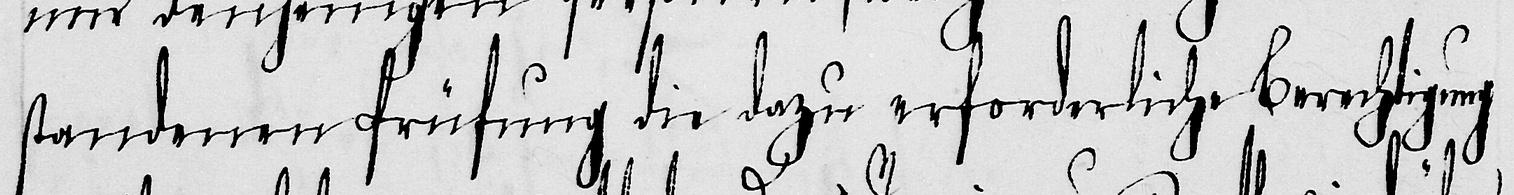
standenen Prüfung die dazu erforderliche Berechtig¬
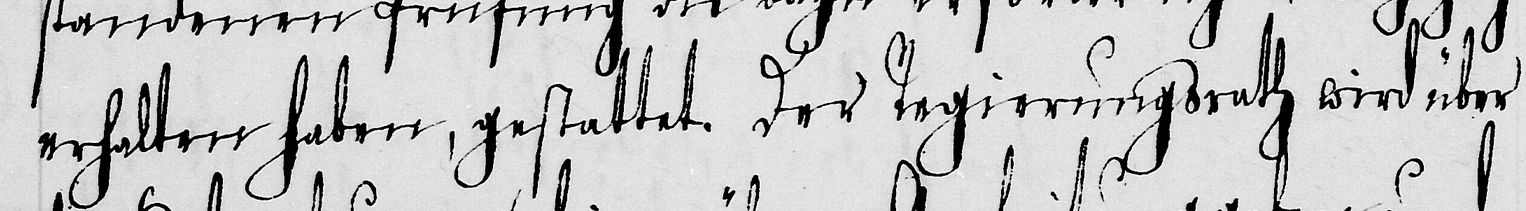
erhalten haben, gestattet. Der Regierungsrath wird über
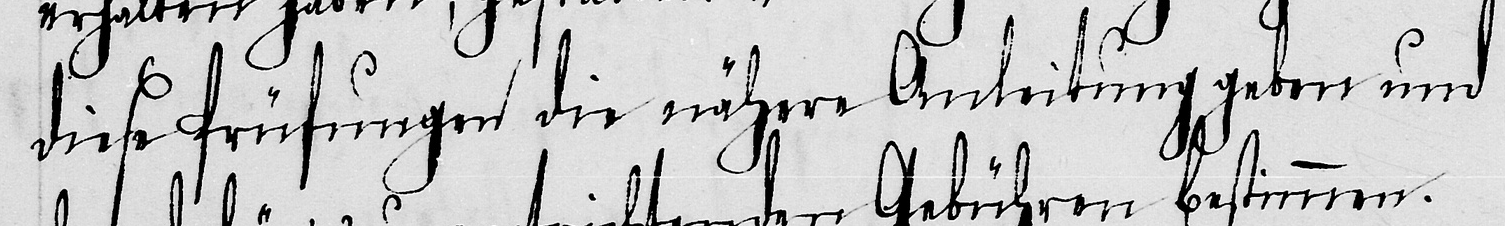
diese Prüfungen die nähere Anleitung geben und
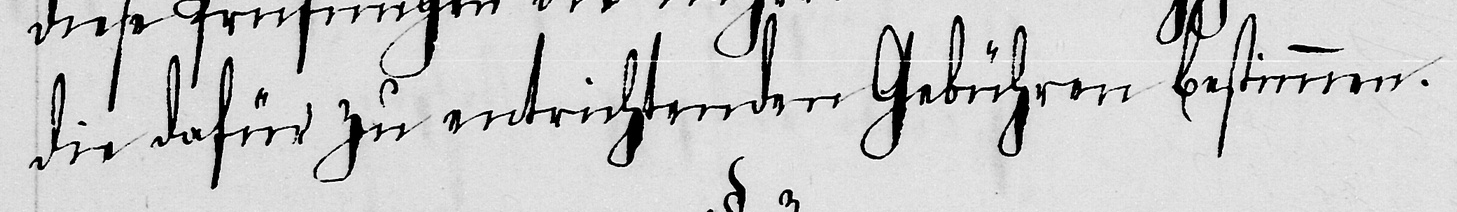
die dafür zu entrichtenden Gebühren bestimmen.
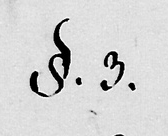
§. 3.
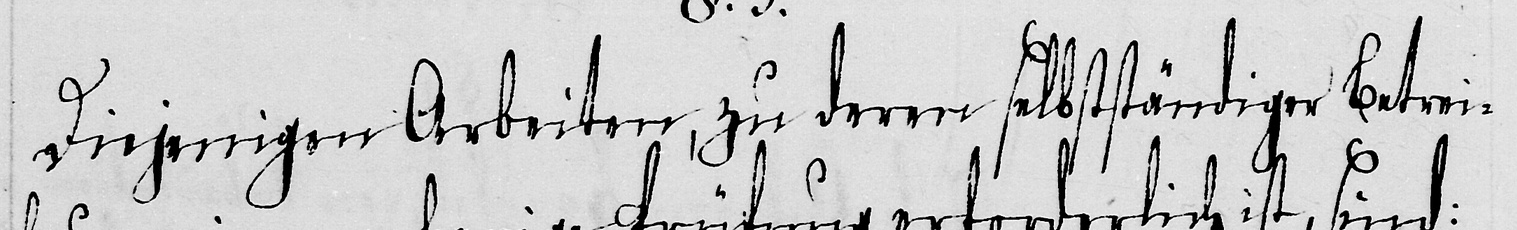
Diejenigen Arbeiten, zu deren selbstständiger Betre¬
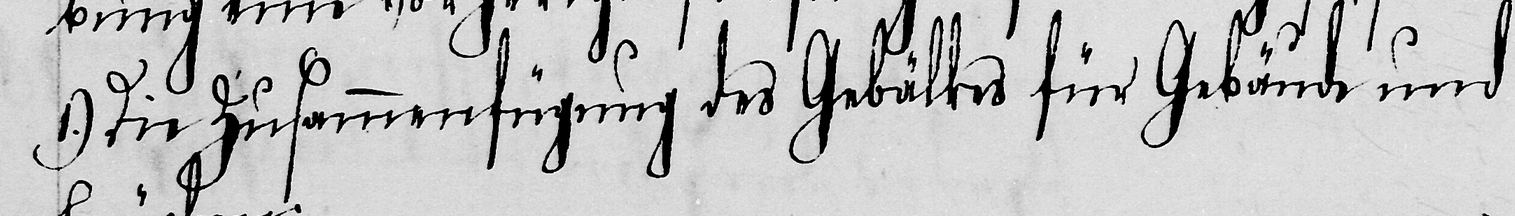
1.) Die Zusammenfügung des Gebälkes für Gebäude und
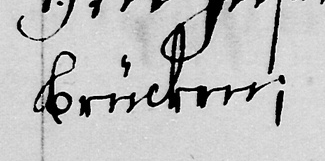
Brücken;
